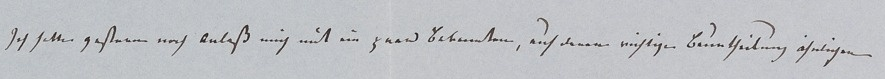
Ich hatte gestern noch Anlaß mich mit ein paar Bekannten, auf deren richtige Beurtheilung ähnlicher
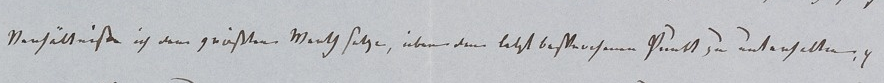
Verhältniße ich den größten Werth setze, über den letztbesprochenen Punkt zu unterhalten; &
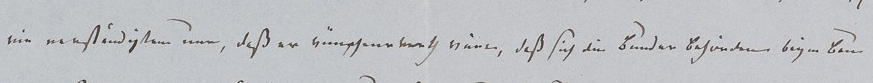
wir verständigten uns, daß es wünschenswerth wäre, daß sich die Bundes Behörden beym Bau
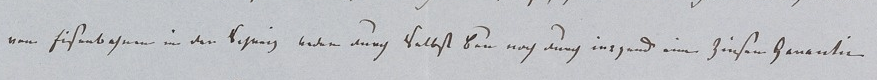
von Eisenbahnen in der Schweiz weder durch Selbst Bau noch durch irgend eine Zinsen Garantie
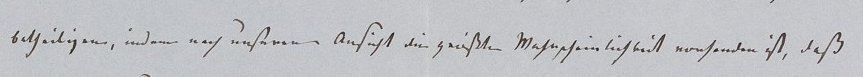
betheiligen, indem nach unserer Ansicht die größte Wahrscheinlichkeit vorhanden ist, daß
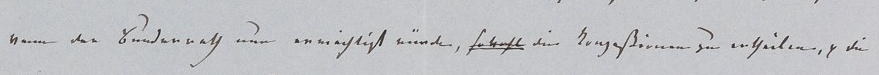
wenn der Bundesrath nur ermächtigt würde, sonnst die Konzeßionen zu ertheilen, & die
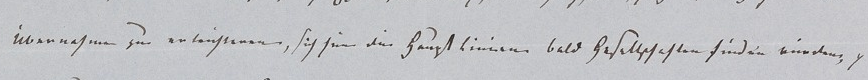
Übernahmen zu erleichteren, sich für die Haupt Linien bald Gesellschaften finden würden, &
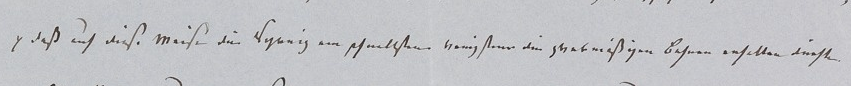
& daß auf diese Weise die Schweiz am schnellsten wenigstens die zwekmäßigen Bahnen erhalten dürfte.
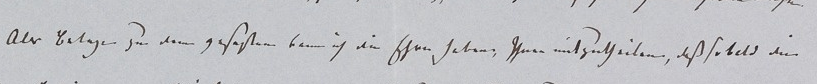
Als Belege zu dem gesagten kann ich die Ehre haben, Ihnen mitzutheilen, daß sobald die
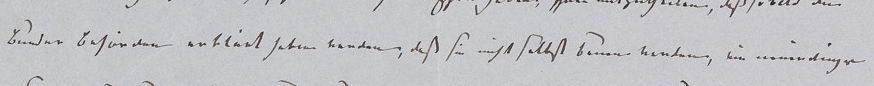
Bundes Behörden erklärt haben werden, daß sie nicht selbst bauen werden, wir neuerdings
